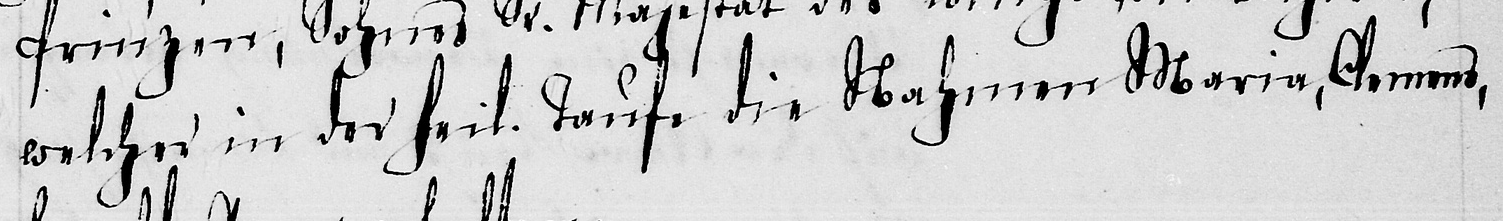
welcher in der heil. Taufe die Nahmen Maria, Clemens
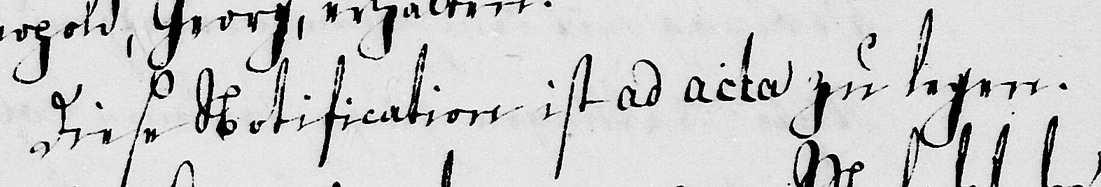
Diese Notification ist ad acta zu legen.
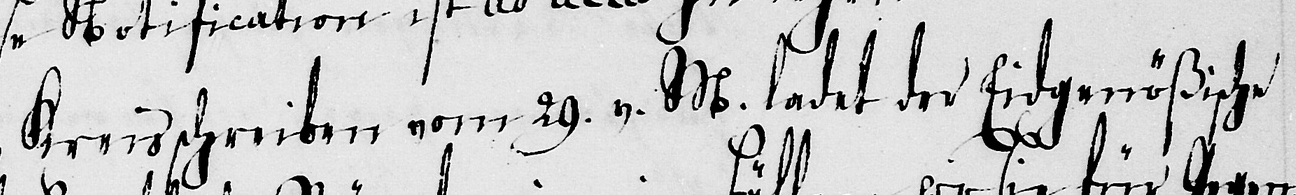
Kreisschreiben vom 29. v. M. ladet der Eidgenößische
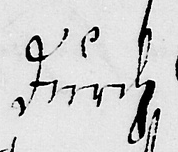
Durch
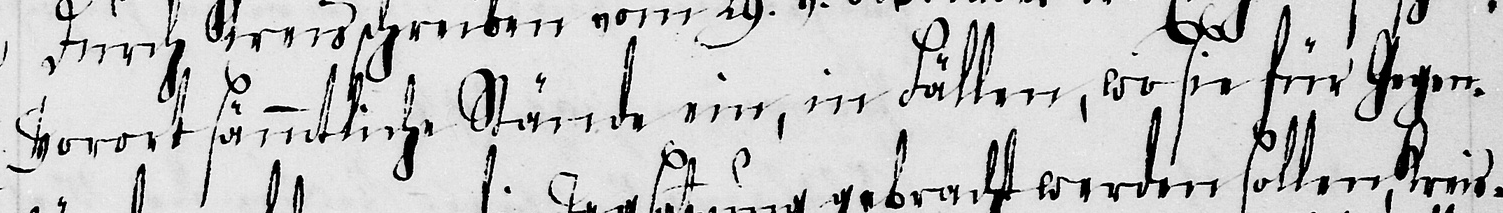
Vorort sämmtliche Stände ein, in Fällen, wo sie für Gegen¬
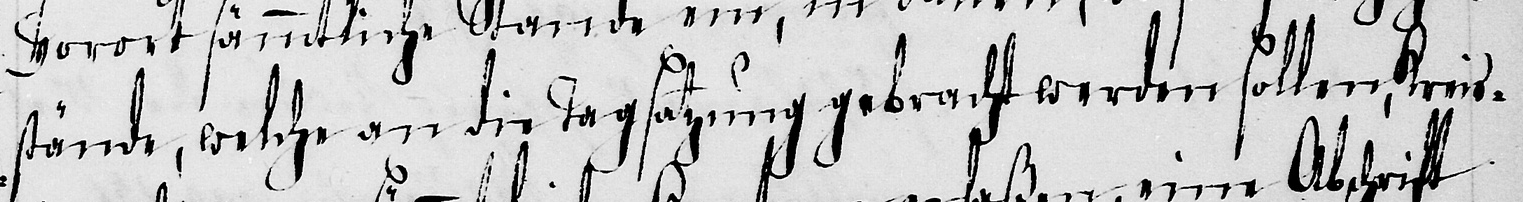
stände, welche an die Tagsatzung gebracht werden sollen, Krei¬
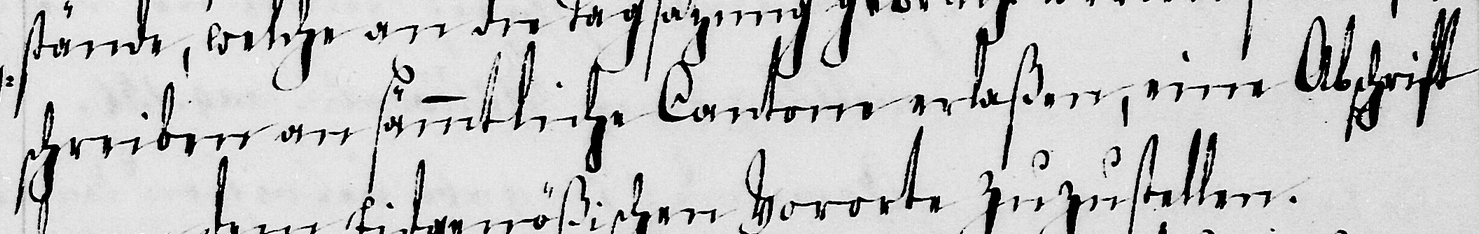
schreiben an sämmtliche Cantone erlaßen, eine Abschrift
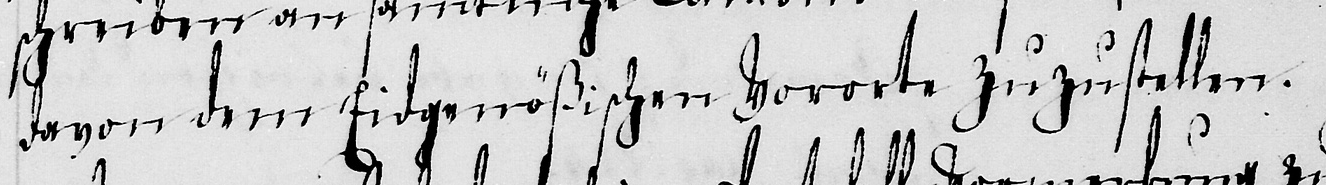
davon dem Eidgenößischen Vororte zuzustellen.
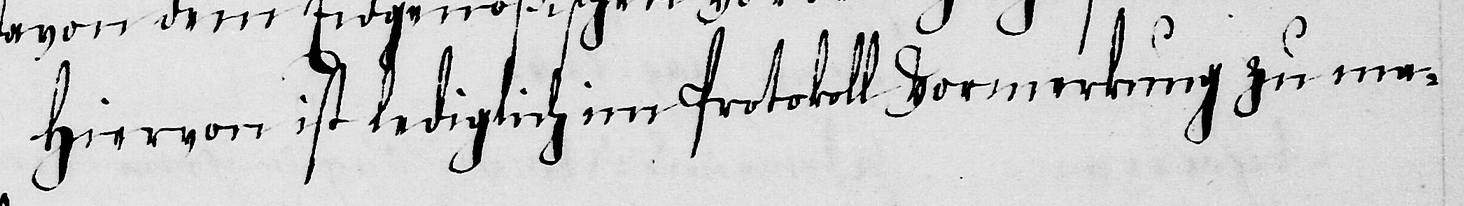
Hiervon ist lediglich im Protokoll Vormerkung zu ma¬
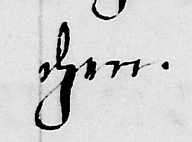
chen.
